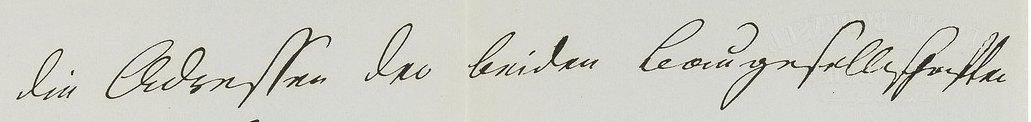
die Adressen der beiden Baugesellschaften
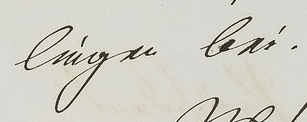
liegen bei.
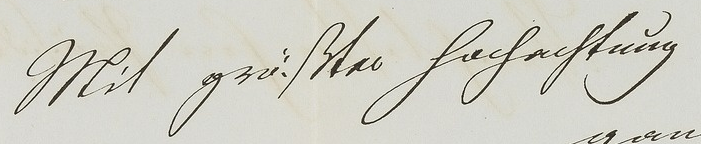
Mit größter Hochachtung
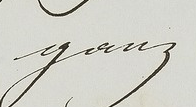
ganz
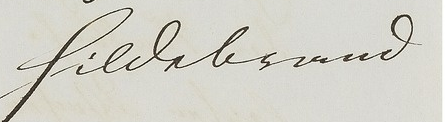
Hildebrand
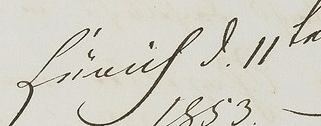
Zürich d. 11ten
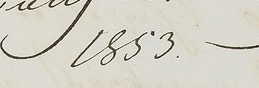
1853.
